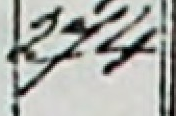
274
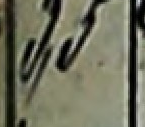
3,5
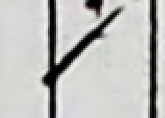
7
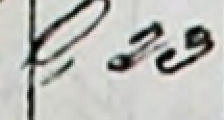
0,23
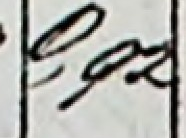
0,92
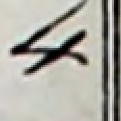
4
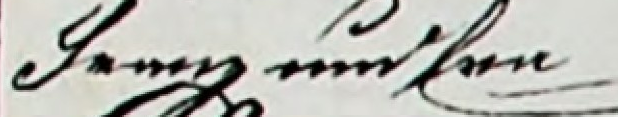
Franz und Eva
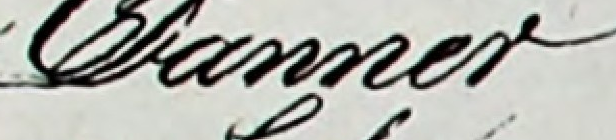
Danner
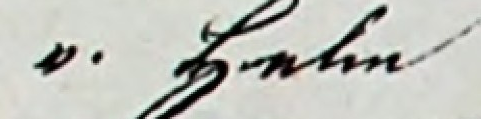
v. Helm
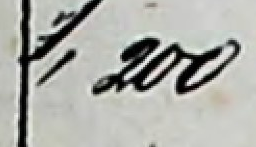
1,200
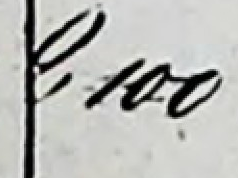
0,100
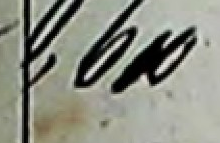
0,610
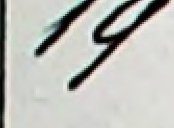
19
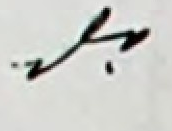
do
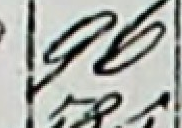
96
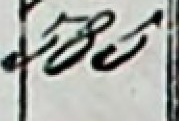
585
